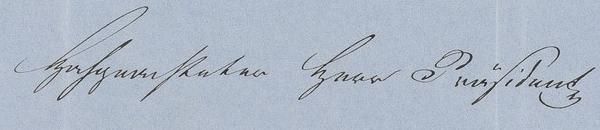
Hochgeachteter Herr Präsident
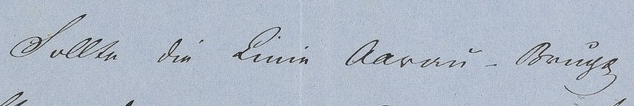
Sollte die Linie Aarau–Brugg
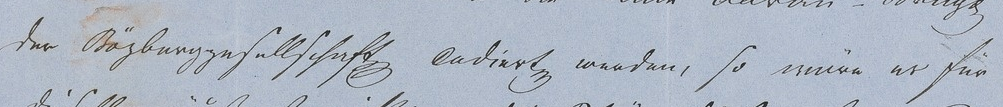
der Bözberggesellschaft codiert werden, so wäre es für
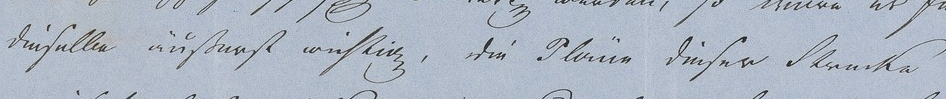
dieselbe äußerst wichtig, die Pläne dieser Strecke
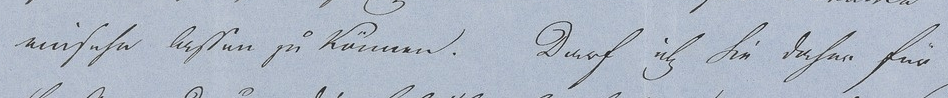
einsehn lassen zu können. Darf ich Sie daher für
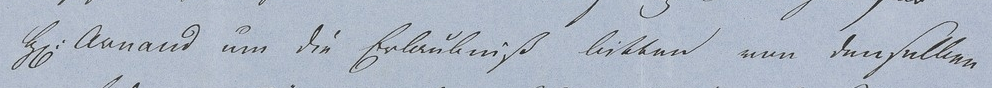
H: Arnaud um die Erlaubniß bitten von denselben
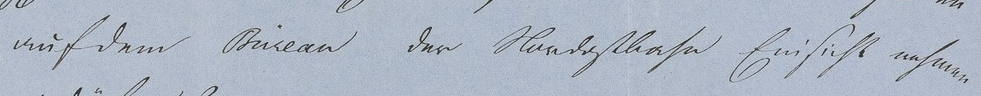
auf dem Büreau der Nordostbahn Einsicht nehmen
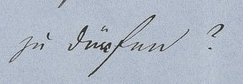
zu dürfen?
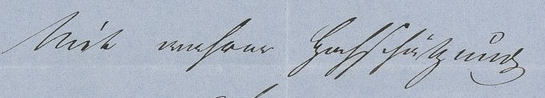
Mit wahrer Hochschätzung
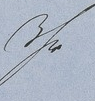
Ihr
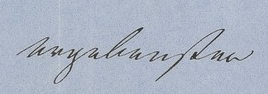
ergebenster
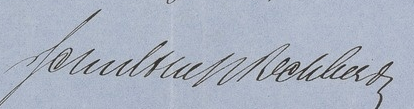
Schulthess Rechberg
